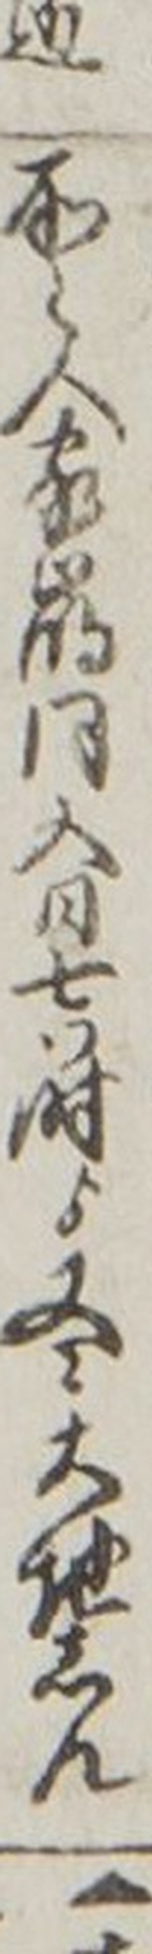所々人家崩同五日七つ時より又々大地しん
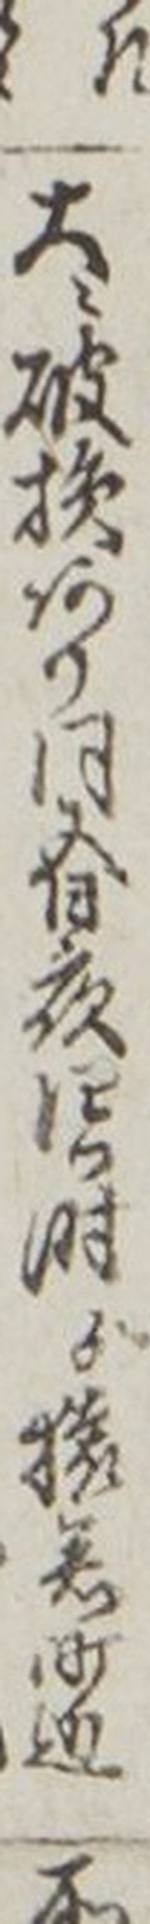大に破損あり同五日夜四つ時より猿若町近
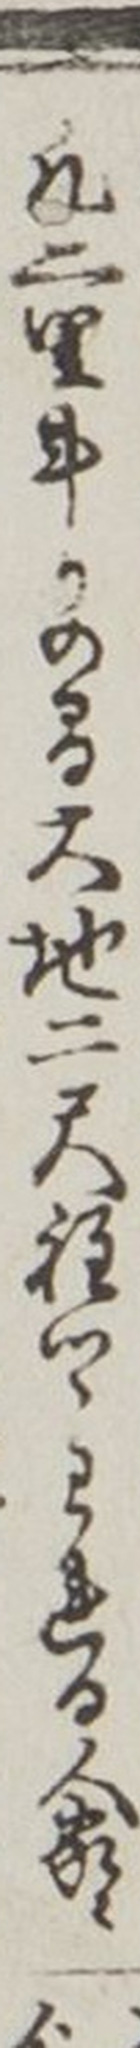凡二里計りの間大地二尺程つゝわれる人家に
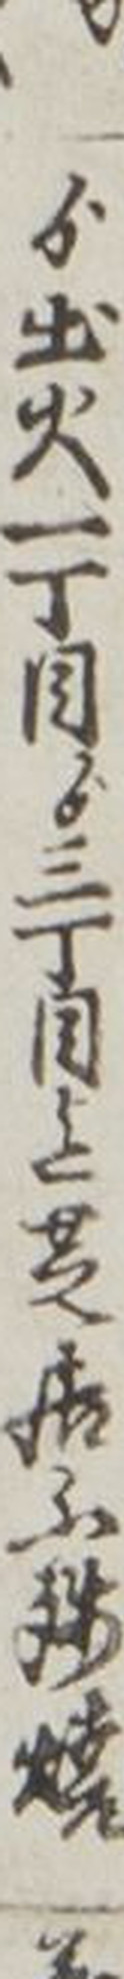より出火一丁目より三丁目迄芝居不残焼
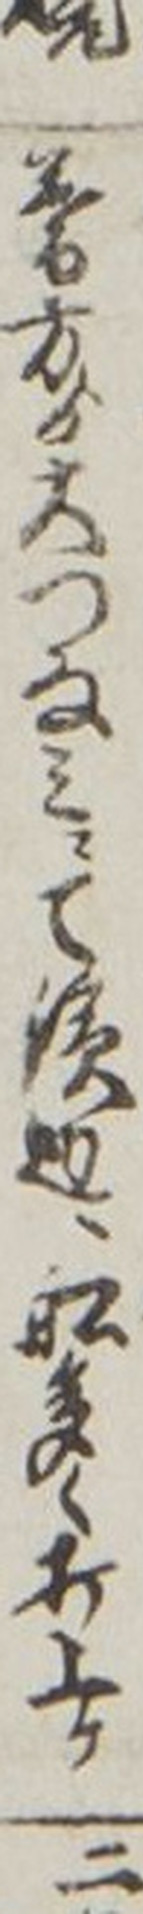暮方より大つなみにて浜辺へ船多く打上け
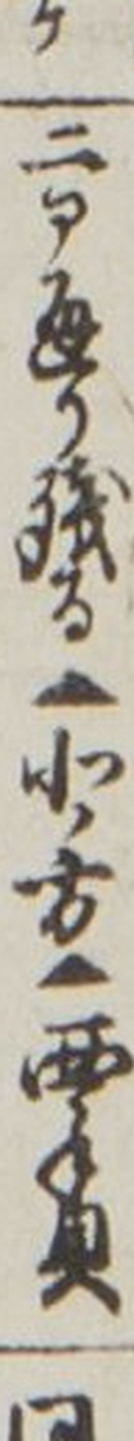二部通り残る▲北ノ方▲西手具
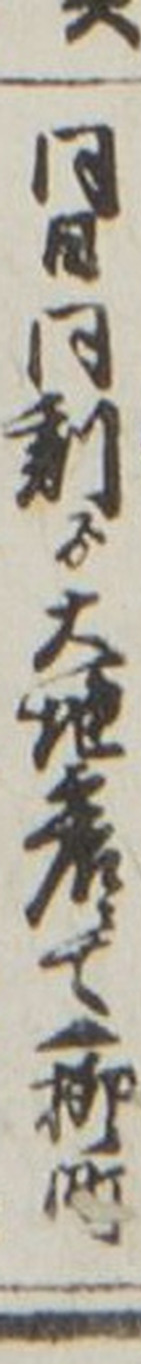同日同刻より大地震にて▲柳町
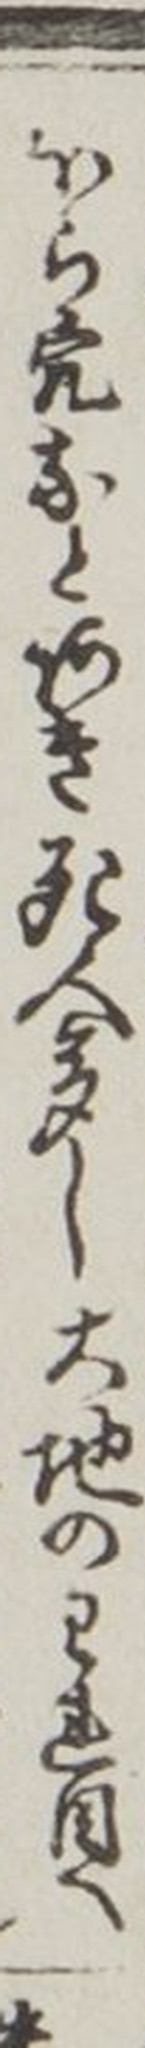ほら穴なとあき死人多し大地のわれ目へ
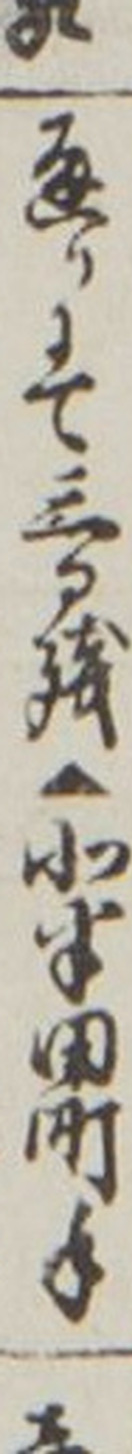通りにて三部残▲北半田町手
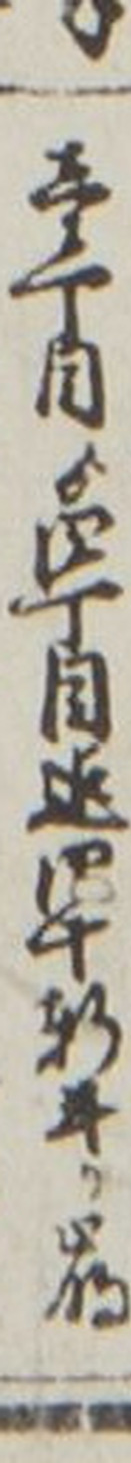壱丁目より四丁目迄四十軒計り崩
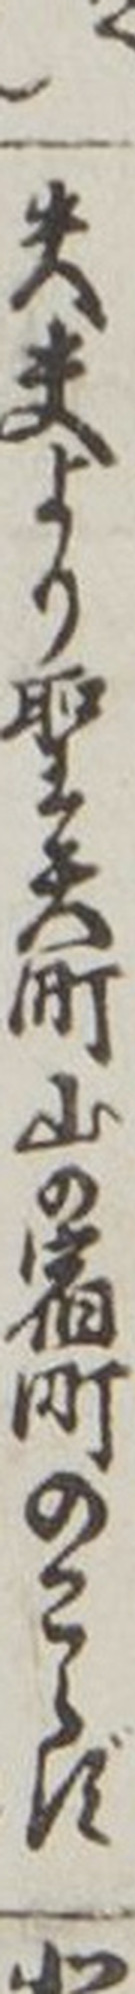失夫より聖天町山の宿町のこらず
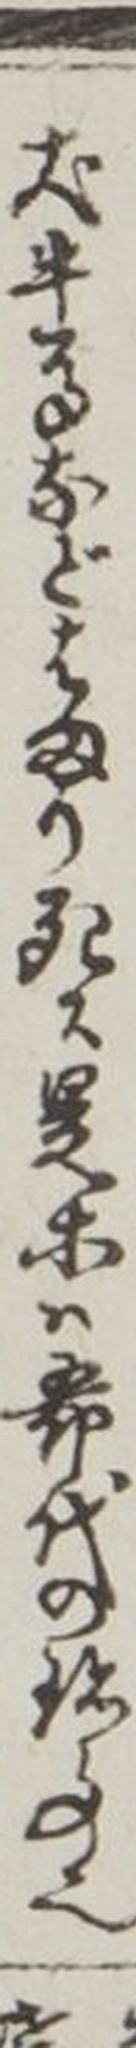犬牛馬などはまり死す是等は希代の珍事也
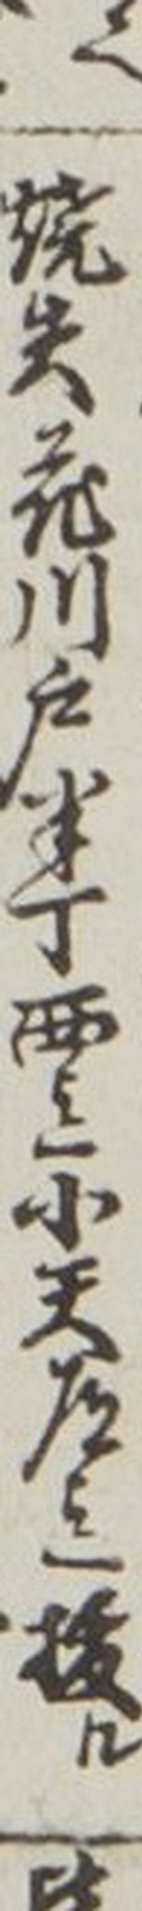焼失花川戸半町西迄小天道迄抜る
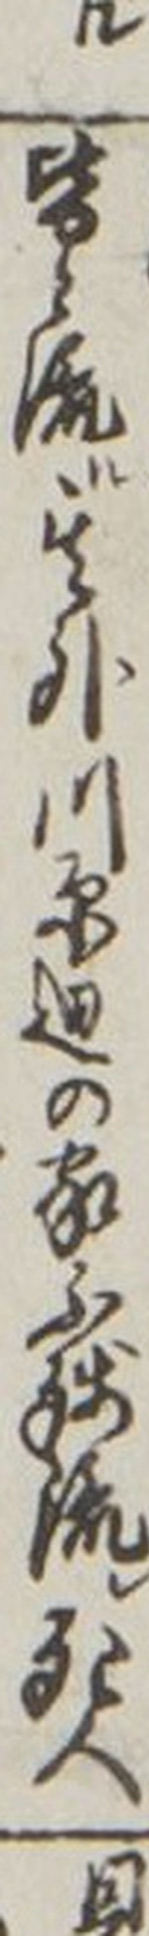皆々流る其外川原辺の家不残流れ死人
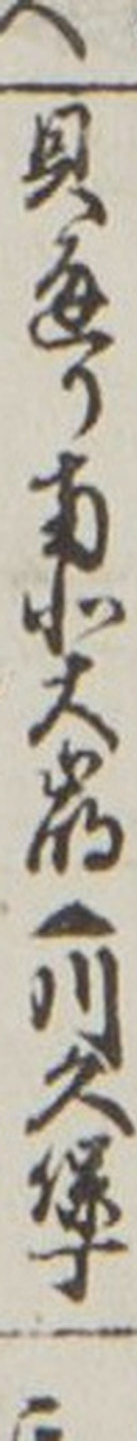具通り南北大崩▲川久保町
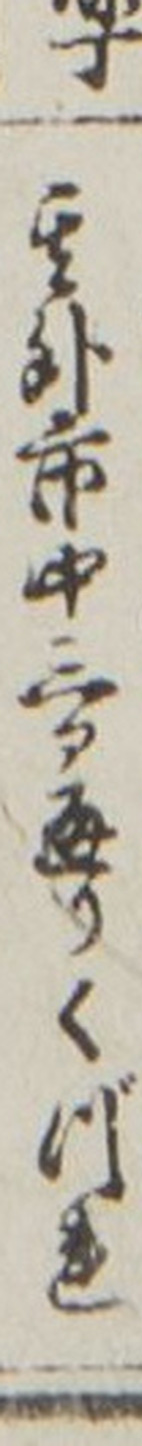其外市中三部通りくづれ
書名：嘉永七年寅十一月諸国大地震大津波并出火
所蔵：あいおいニッセイ同和損保株式会社
